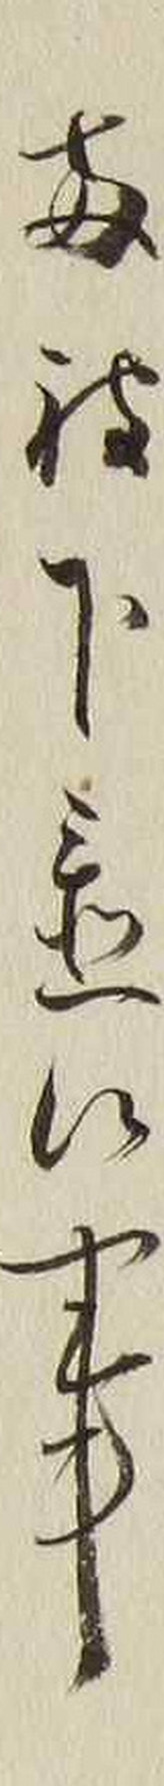両被下置候事
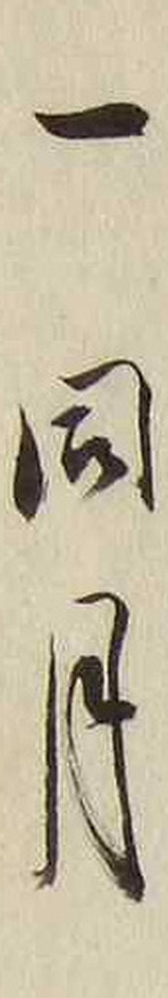一同月

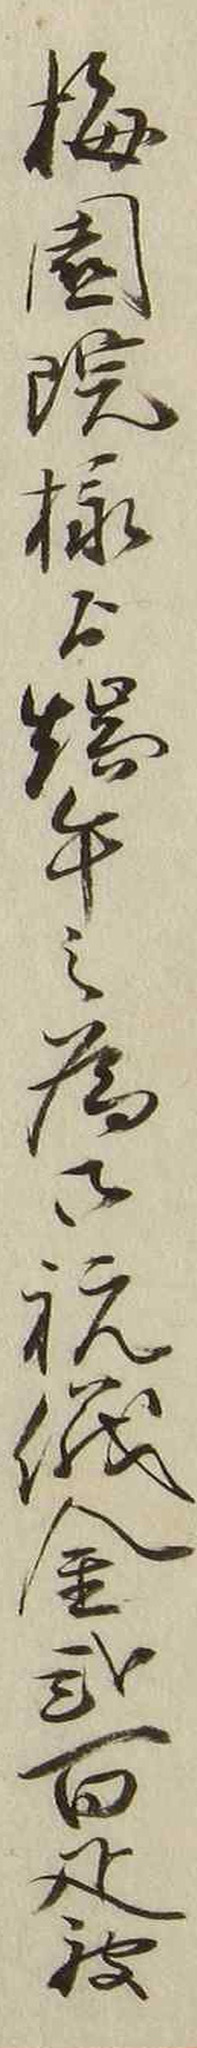梅園院様ゟ端午之為御祝儀金弐百疋被
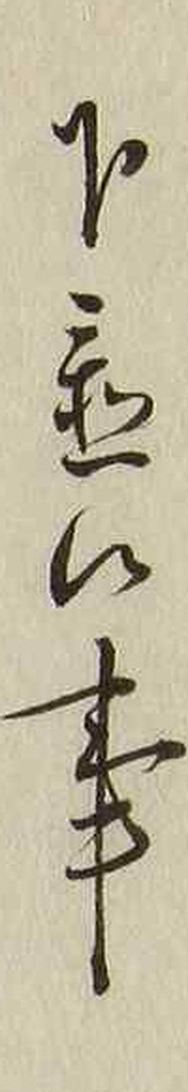下置候事
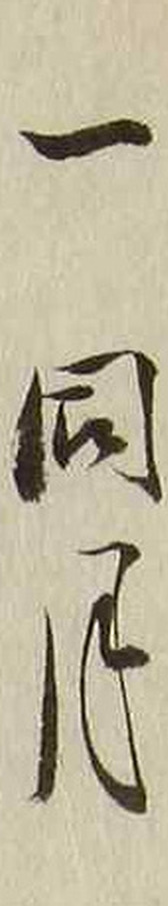一同月
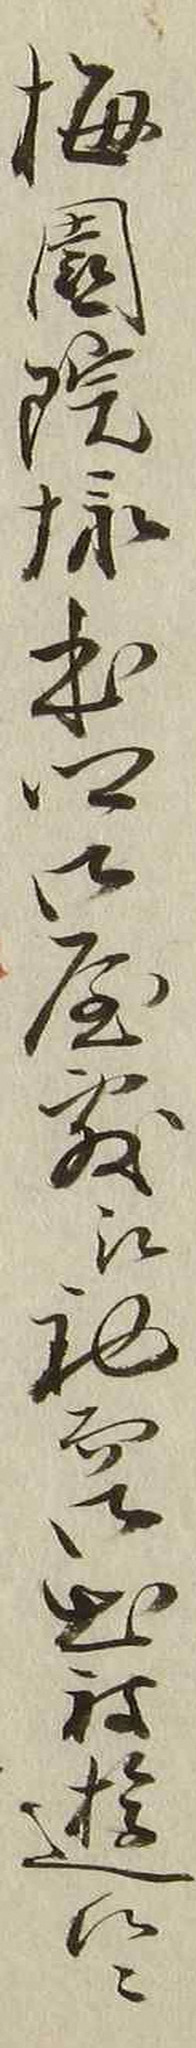梅園院様本郷御屋敷え初而御出被遊候ニ
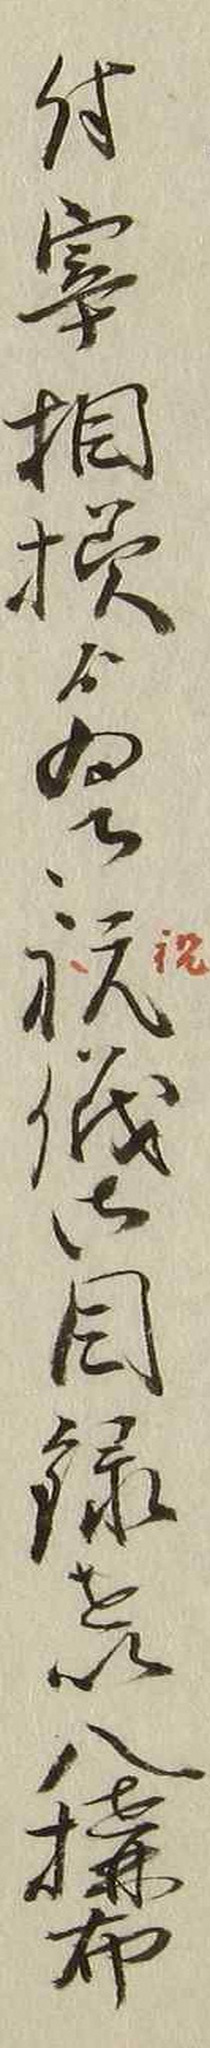付宰相様ゟ為御祝儀御目録を以八構布
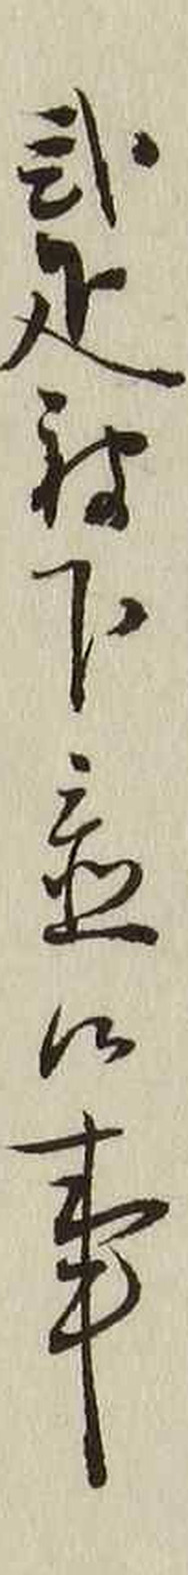弐疋被下置候事
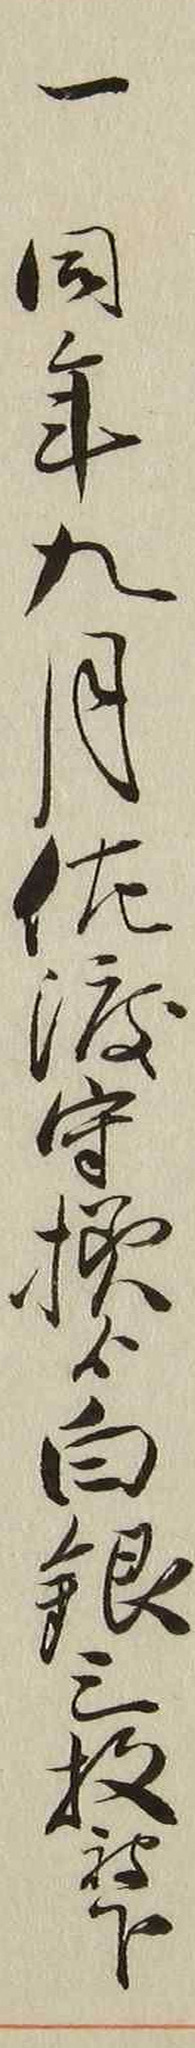一同年九月佐渡守様ゟ白銀三枚被下
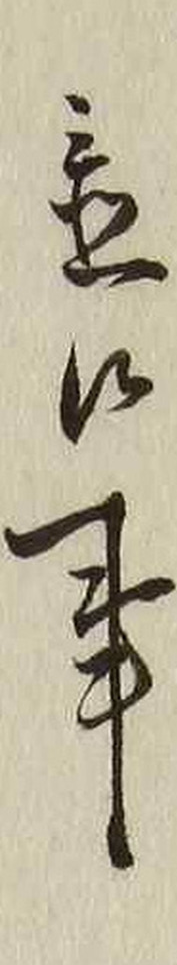置候事
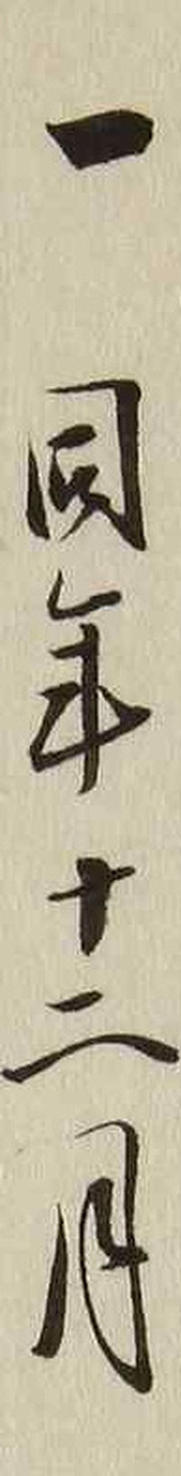一同年十二月
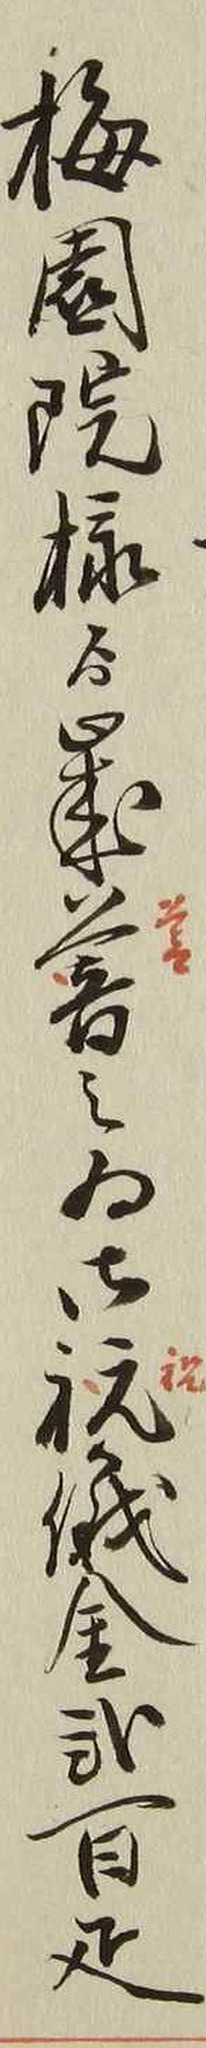梅園院様ゟ端午之為御祝儀金弐百疋被
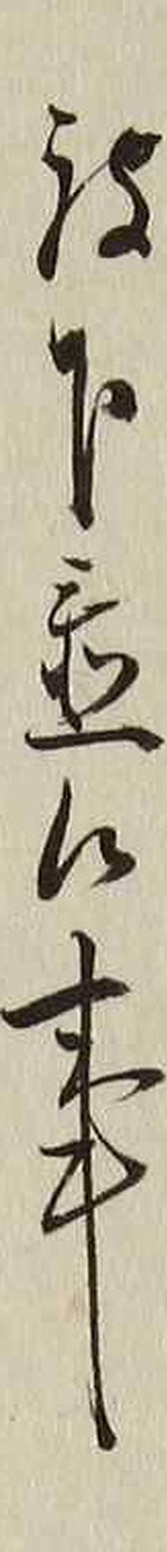被下置候事
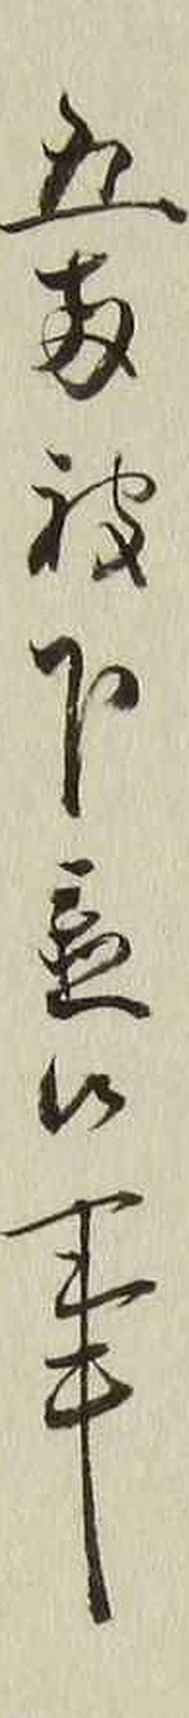五両被下置候事
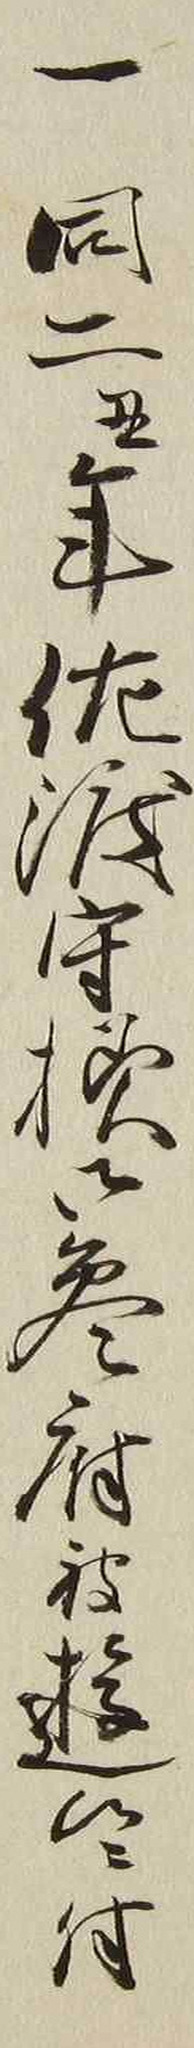一同二丑年佐渡守様御参府被遊候ニ付
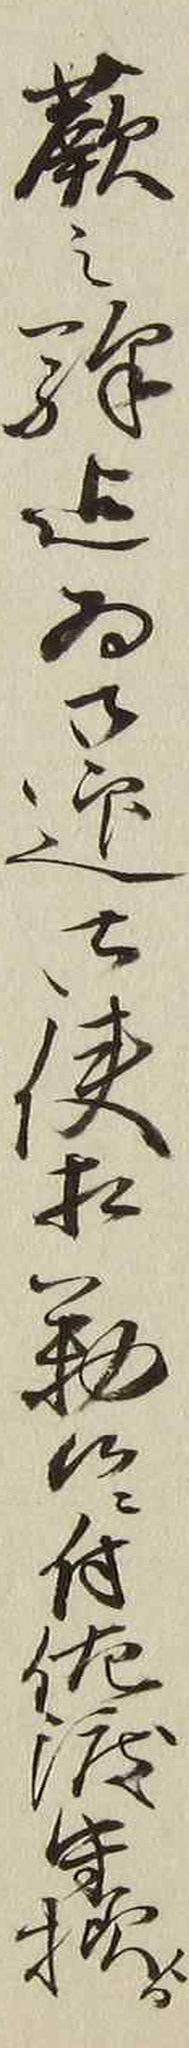蕨之駅迄為御迎御使相勤候ニ付佐渡守様ゟ
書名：諸士系譜　巻之163　な之部5
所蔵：会津若松市立会津図書館
